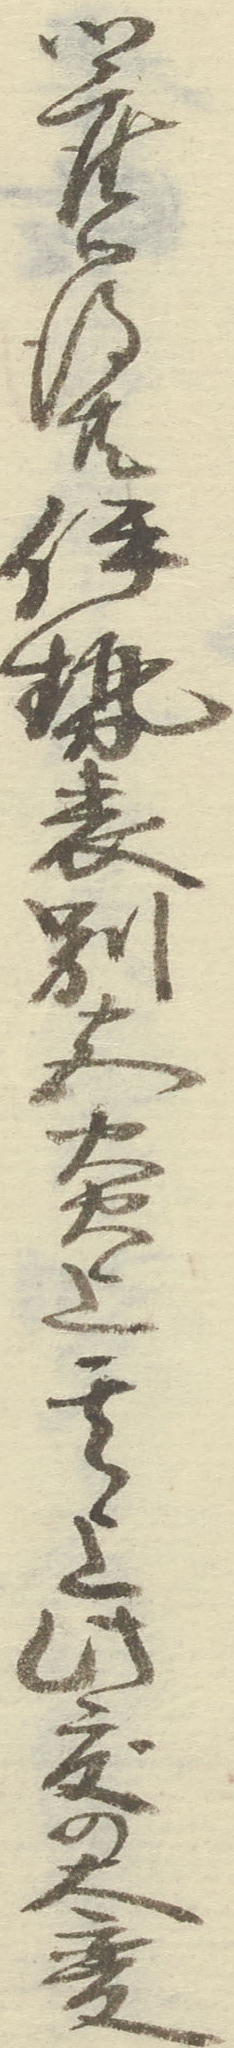御座候得共伊勢表別宮炎上其上此度の大変
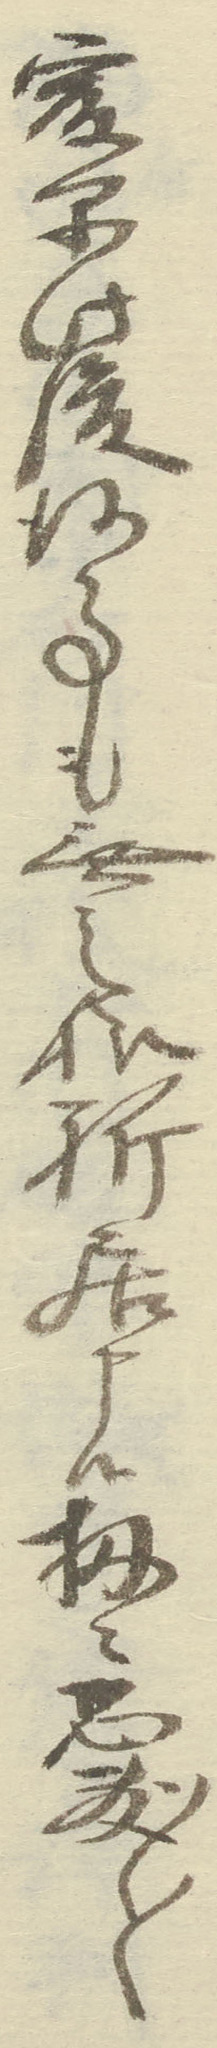最早此後何事も無之様祈居申候扨〻恐敷〳〵〳〵
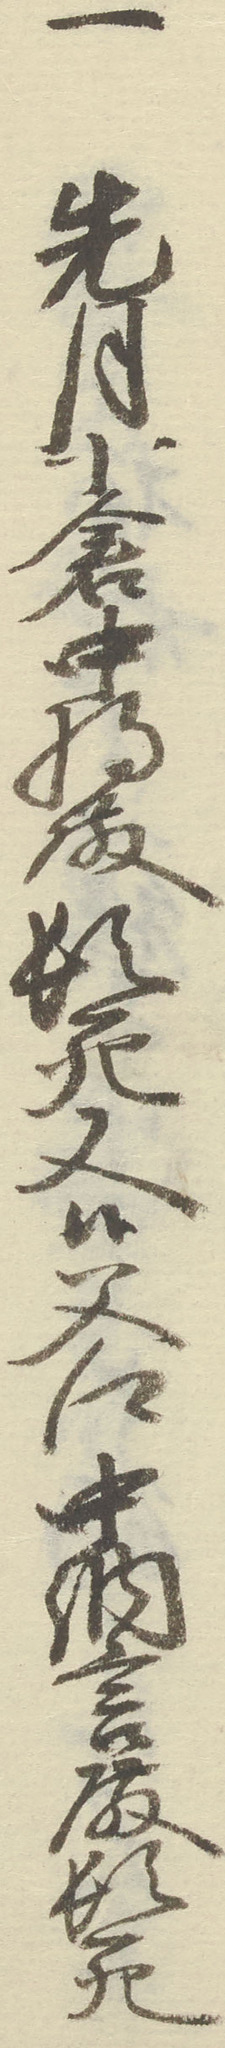一先月小倉中将殿頓死又候父卿中納言殿頓死
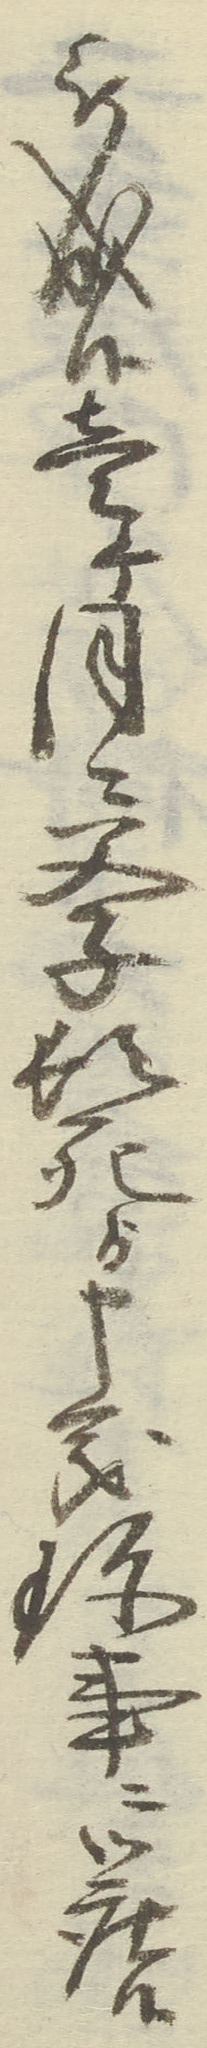被成候壱ヶ月ニ父子頓死と申義珍事ニ御座候

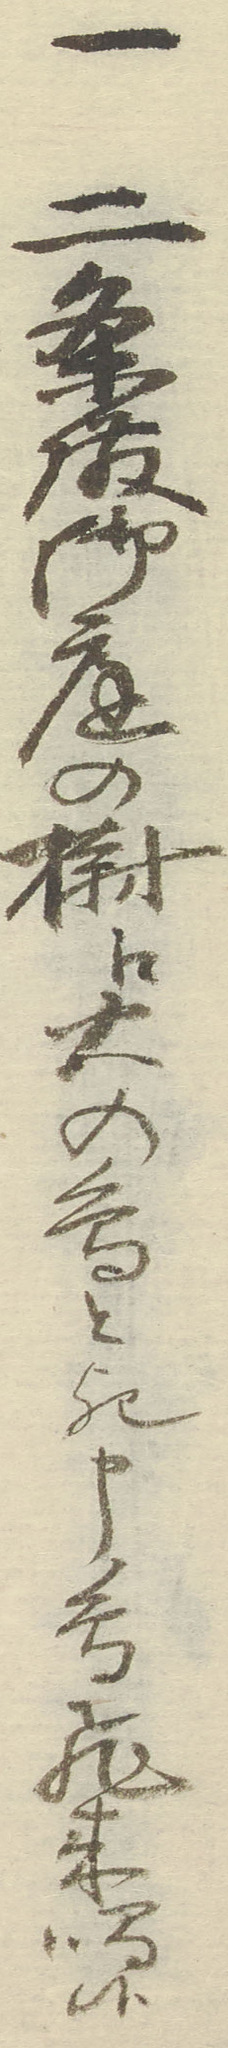一二条殿御庭の樹江火の鳥と欤申鳥飛来鳴候
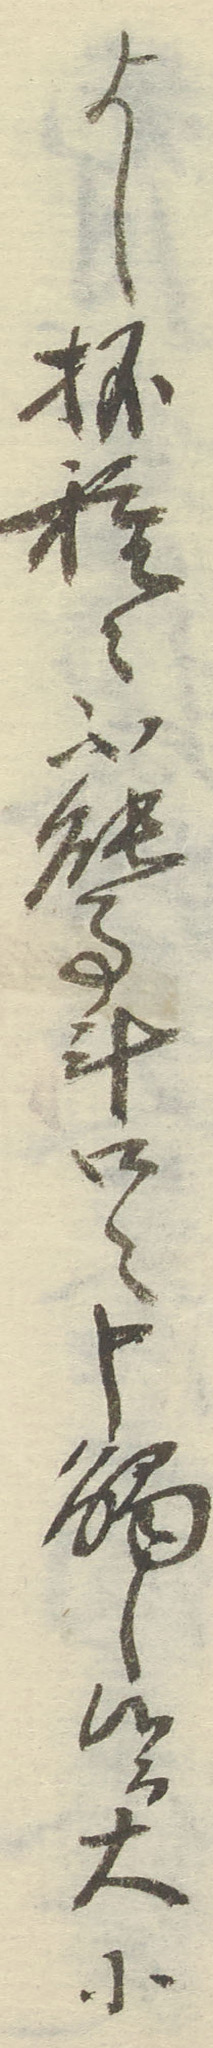よし抔種〻不能事斗口〻申觸候而大小
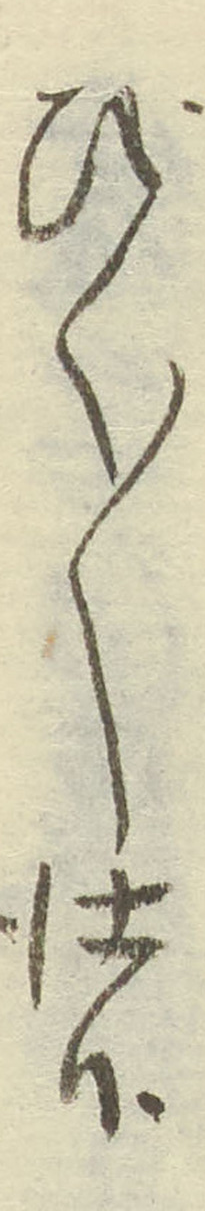びく〳〵仕候
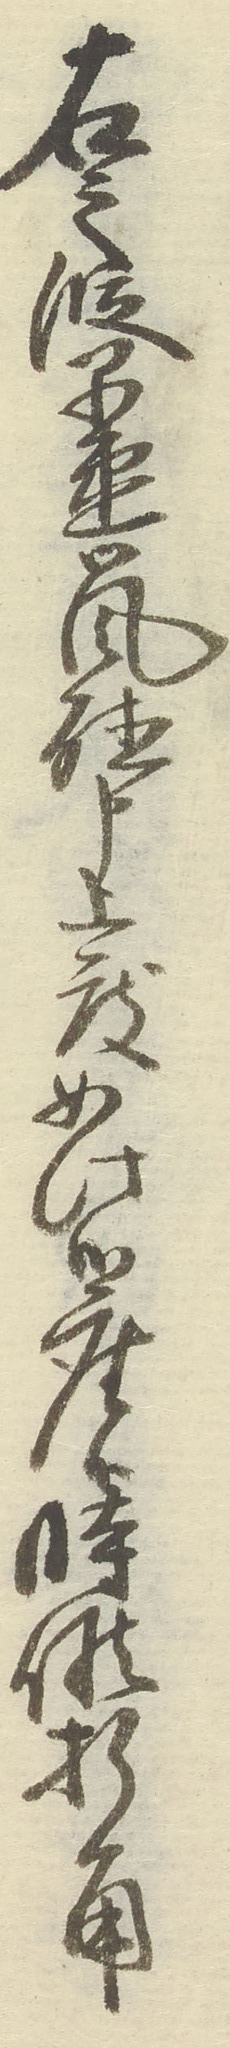右之段早速御風聴申上度如此御座候時候折角
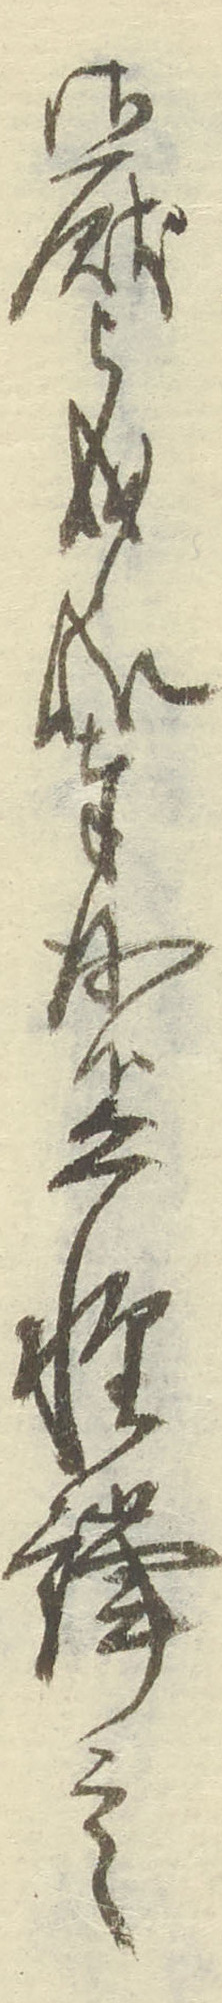御厭被成候奉存候恐惶謹言
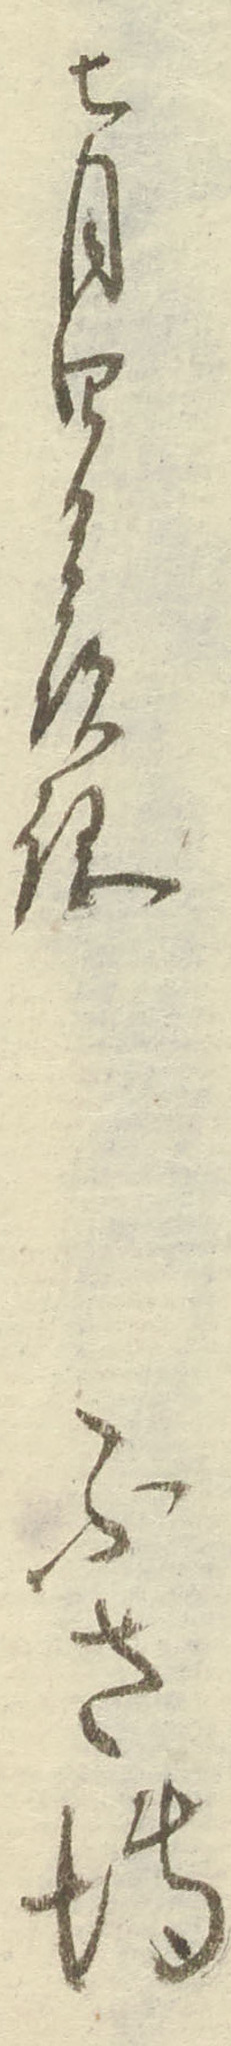七月四日夜認ふさ？
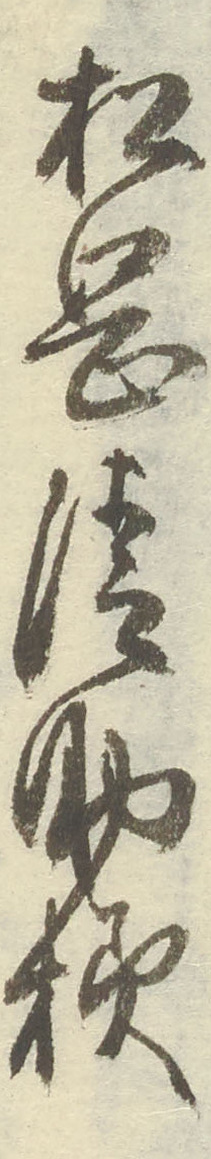松岡清助様
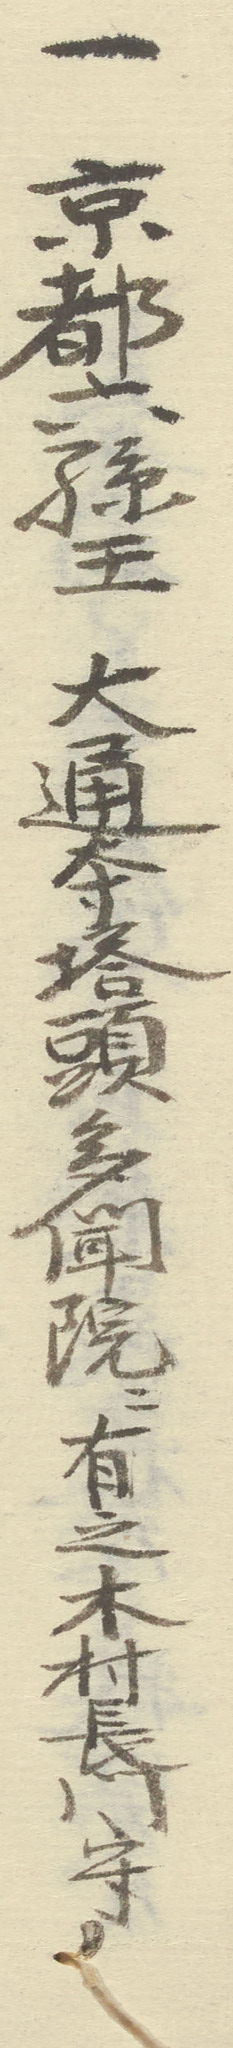一京都六孫王大通本塔頭多聞院ニ有之木村長門守
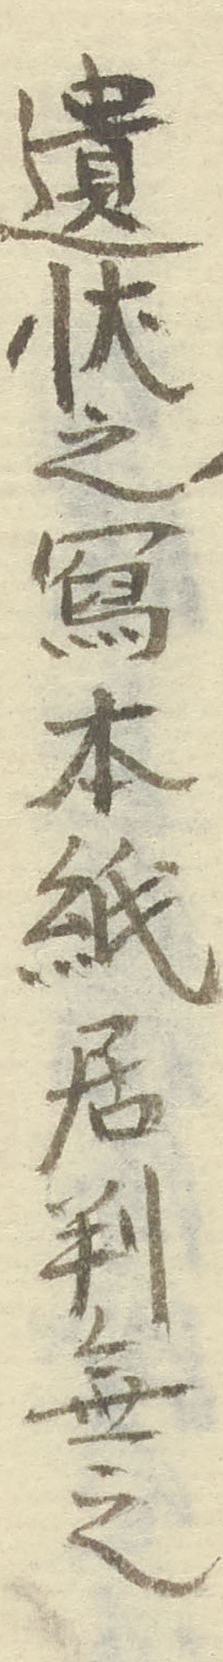遺状之寫本紙居判無之
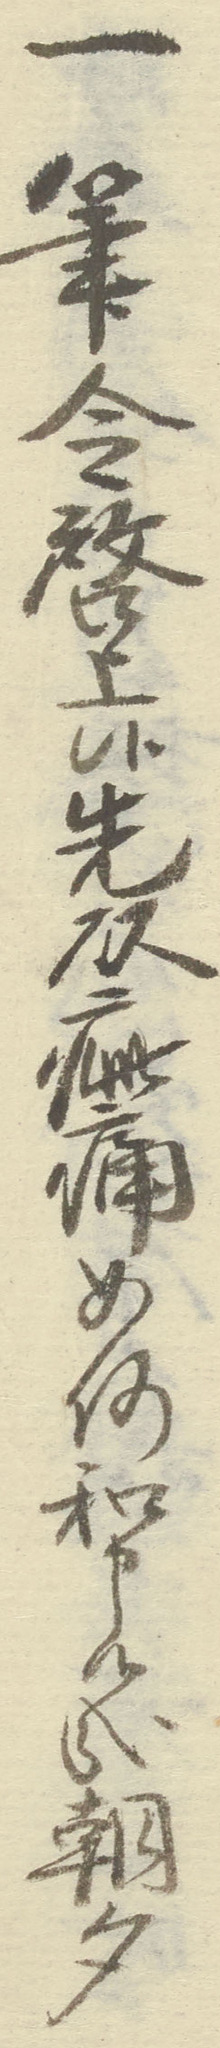一筆令啓上候先頃疵痛如何和申候哉朝夕
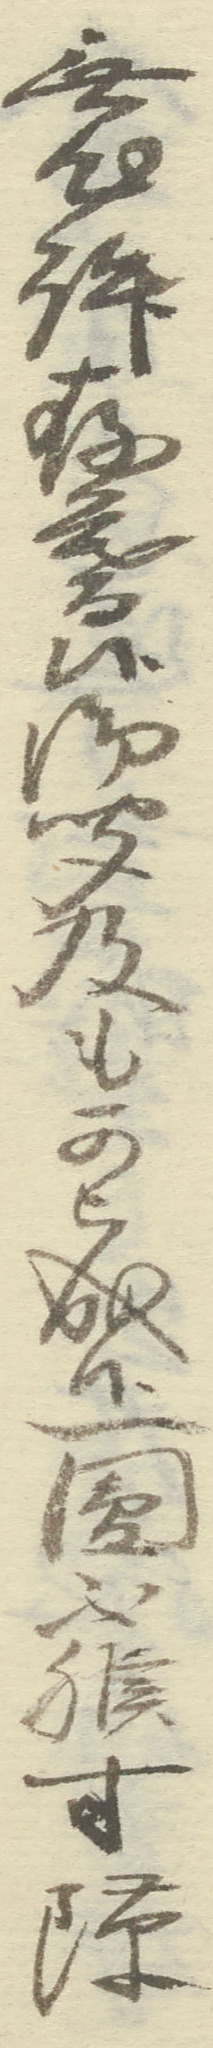無心躰存暮候御聞及も可被成候一圓不？寸隙
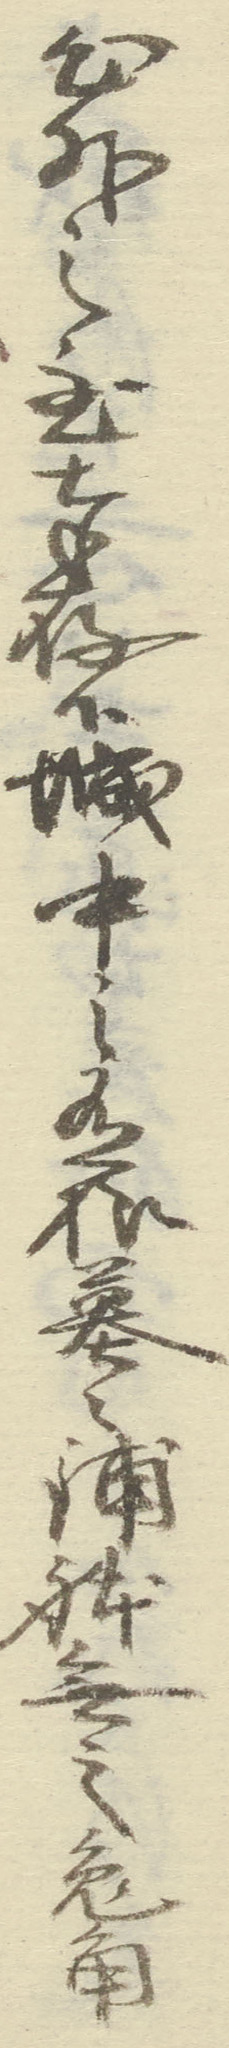心外之至奉存候城中之有様墓〻鋪躰無之兎角
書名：[七月二日京都大地震に付御番衆大木市左衛門より申し越し候書面畧書状写]
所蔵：東京大学総合図書館 General Library in the University of Tokyo, JAPAN
